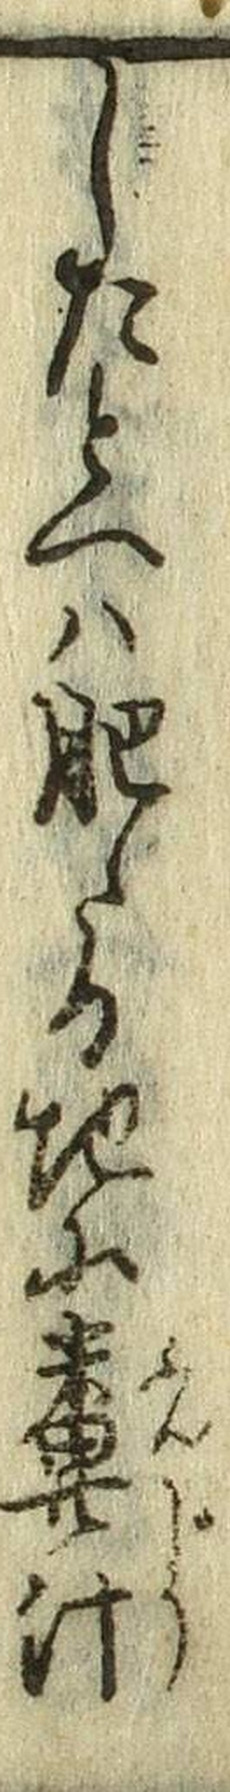したとへは肥たる地に糞汁
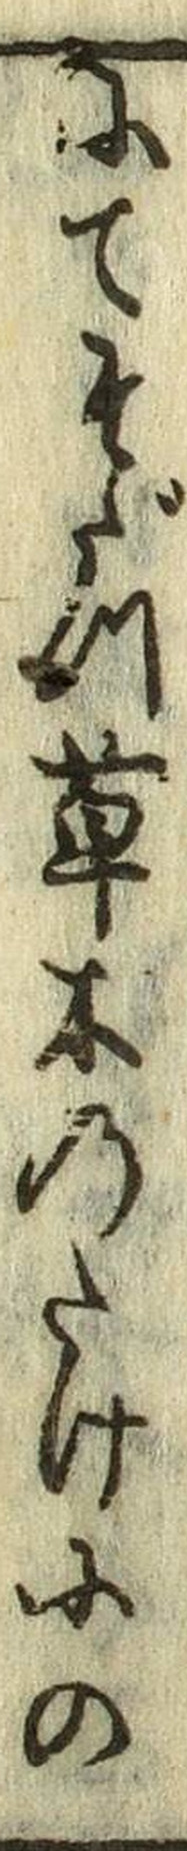にてそだつ草木のたけにの
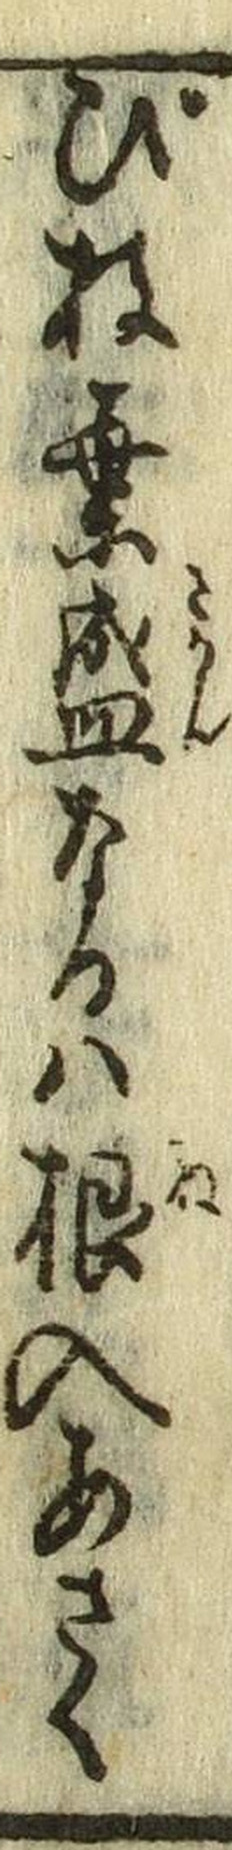び枝葉盛なるは根入あさく
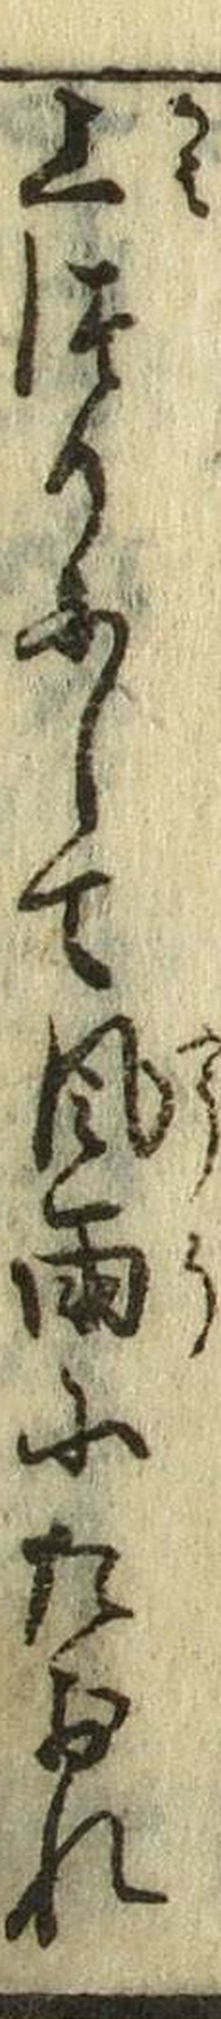上つりにして風雨にたおれ

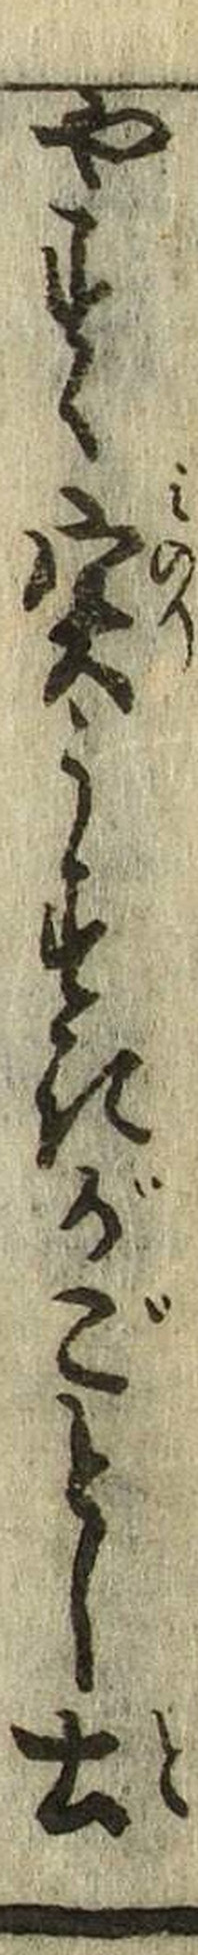やすく実うすきがごとし土
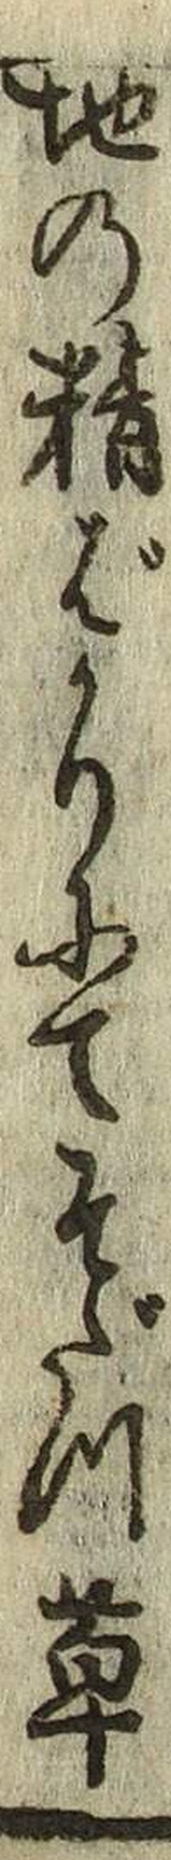地の精ばかりにてそだつ草
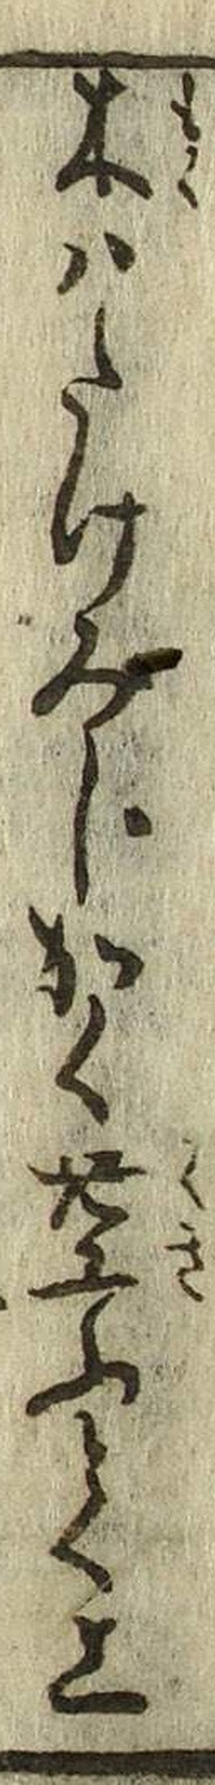木はたけみじかく茎ふとく上
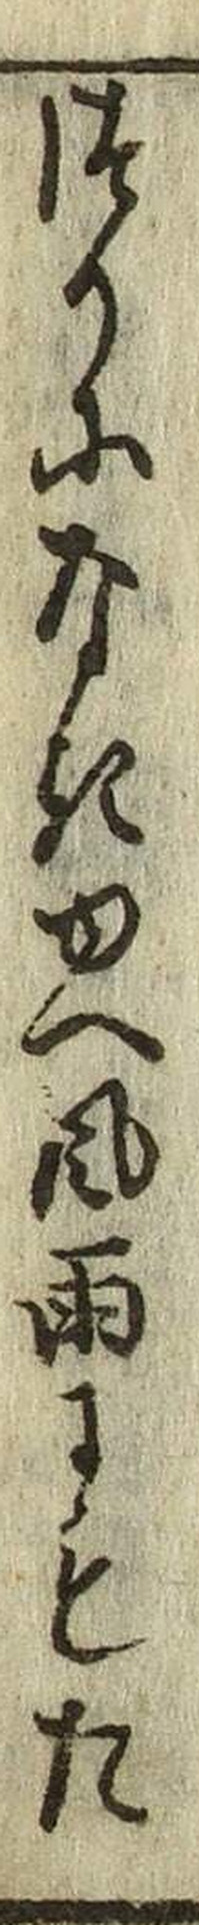つりになきゆへ風雨にもた
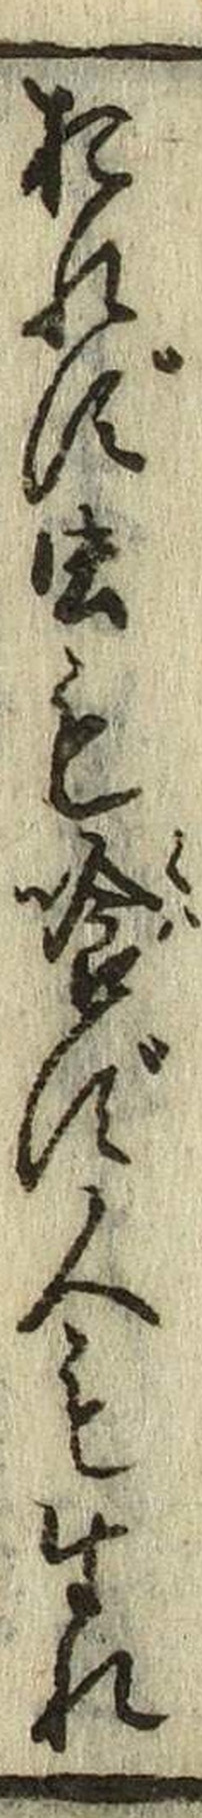おれず虫も喰ず人も生れ
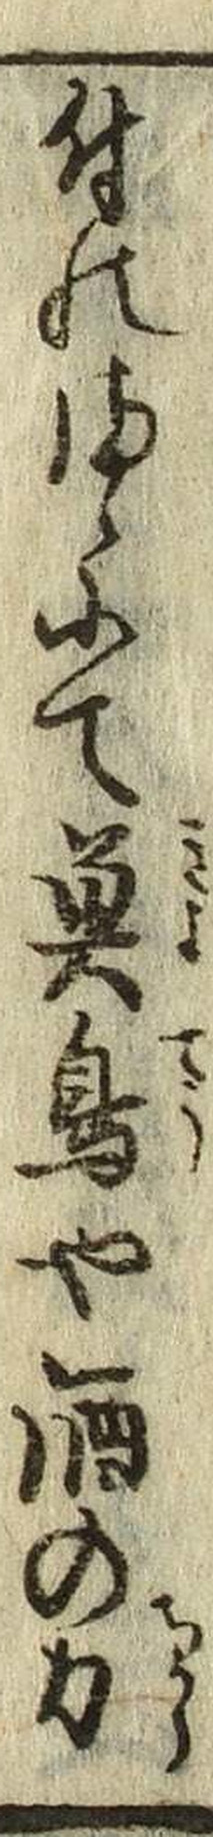付のまゝにて魚鳥や酒の力
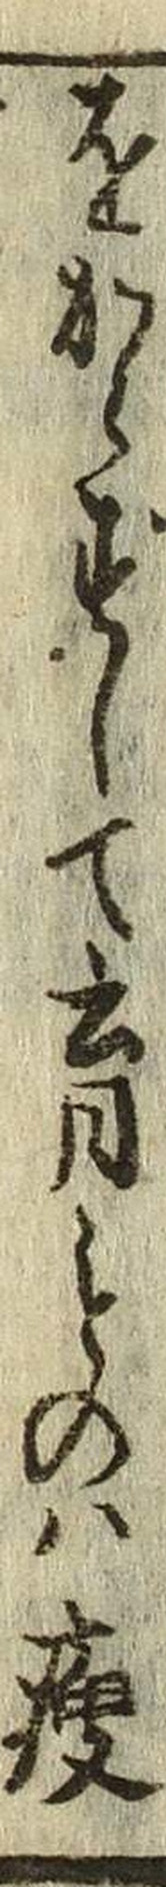をからずして育ものは痩
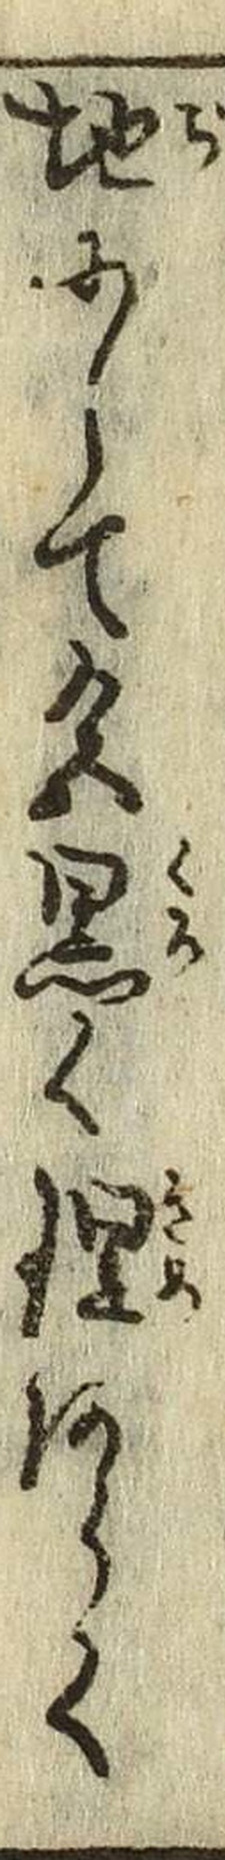地にして色黒く理あらく
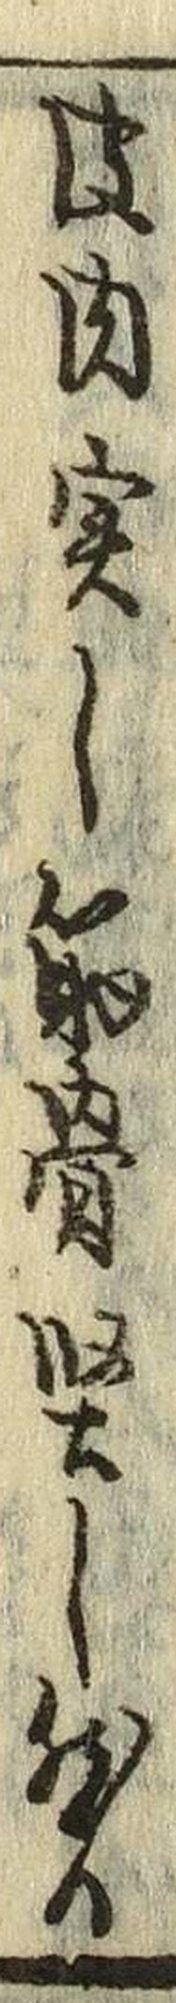皮肉実し筋骨堅し然る
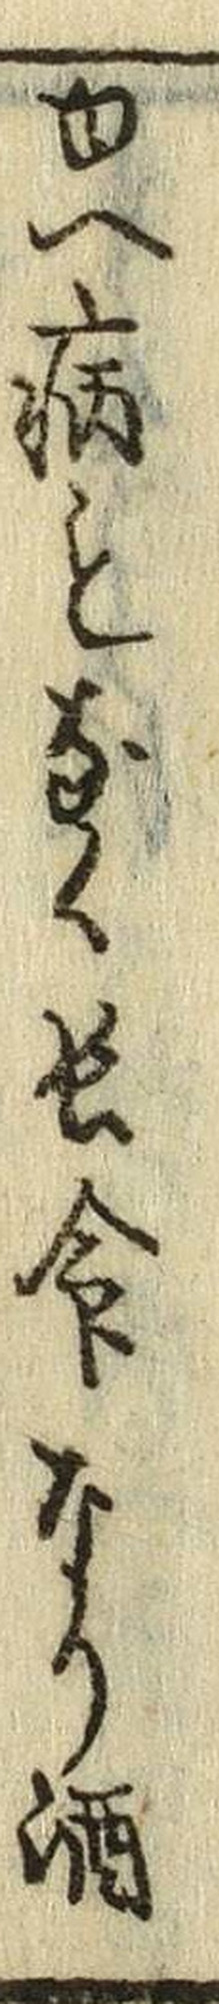ゆへ病もなく長命なり酒
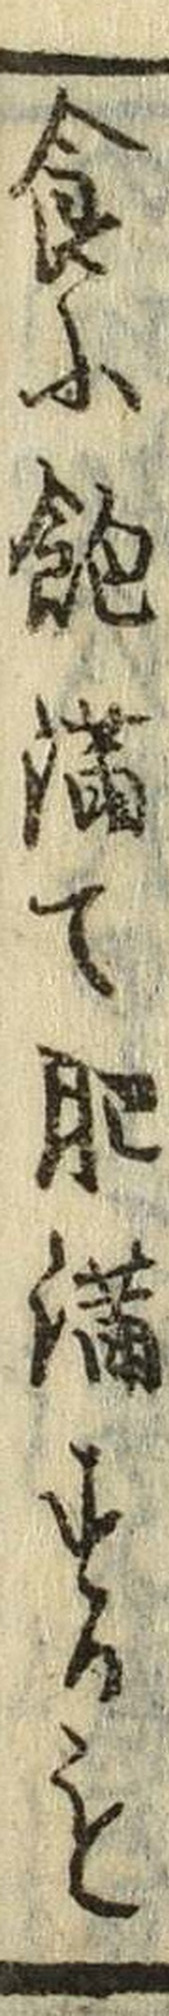食に飽満て肥満するも
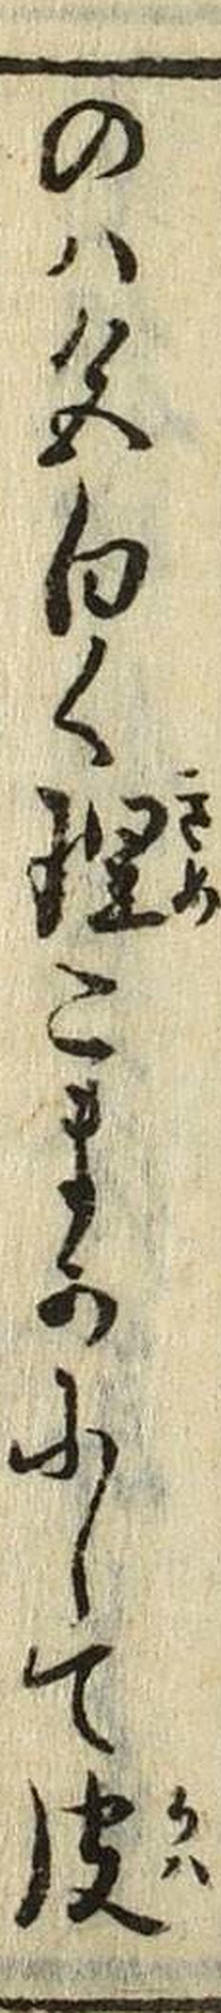のは色白く理こまかにして皮
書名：居家養生記
